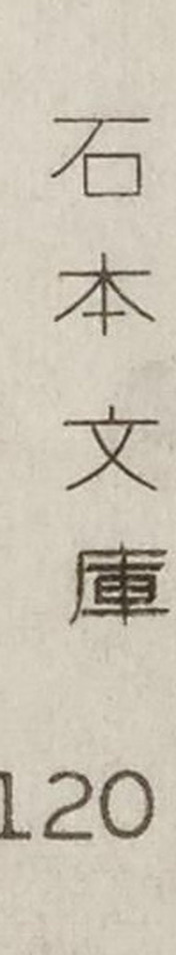石本文庫
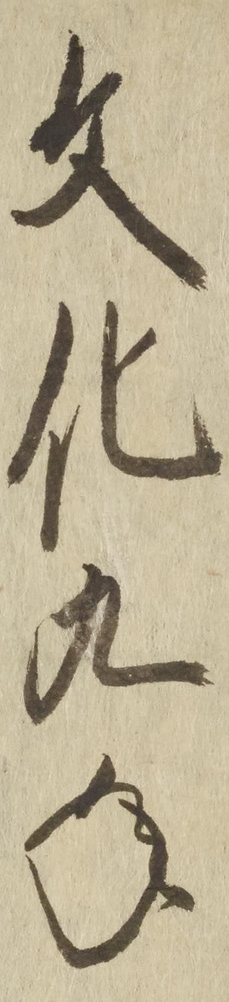文化九年
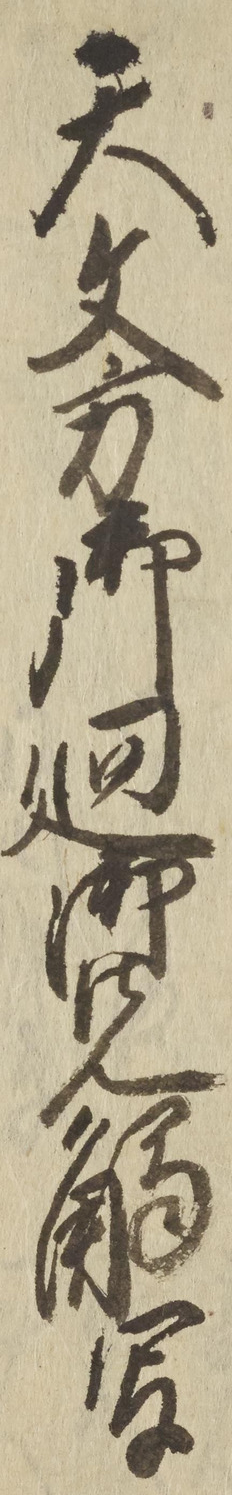天文方御廻御先触写
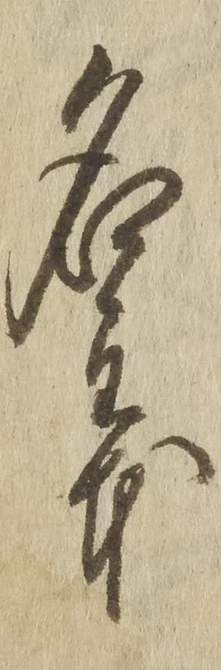名主本

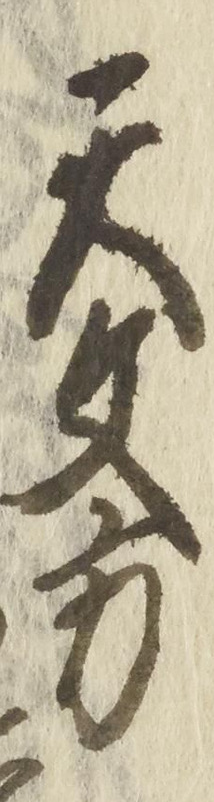天文方
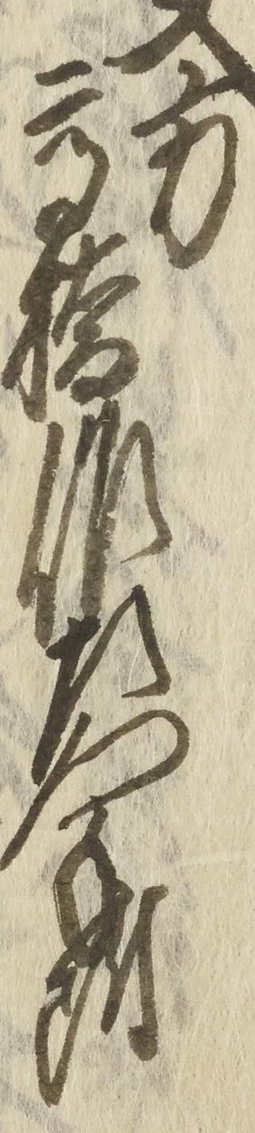高橋作左衛門手附
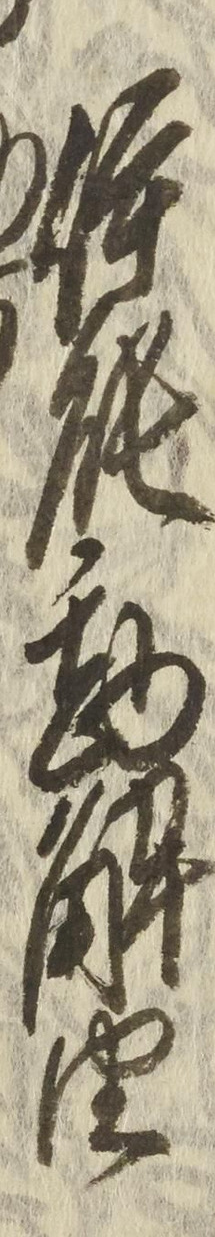伊能勘解由
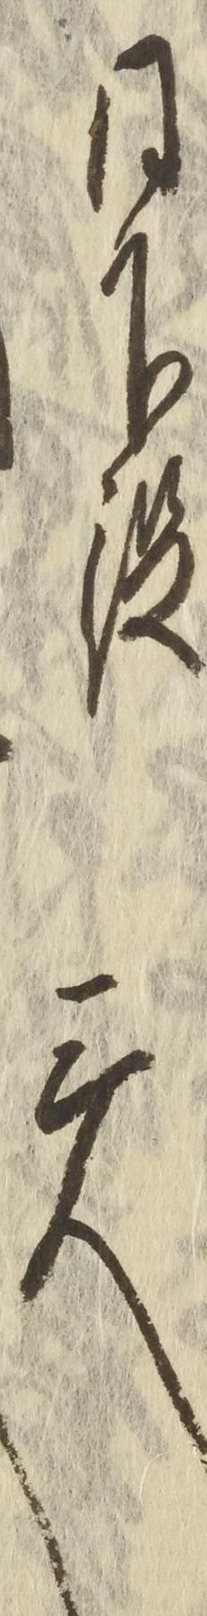同下役三人
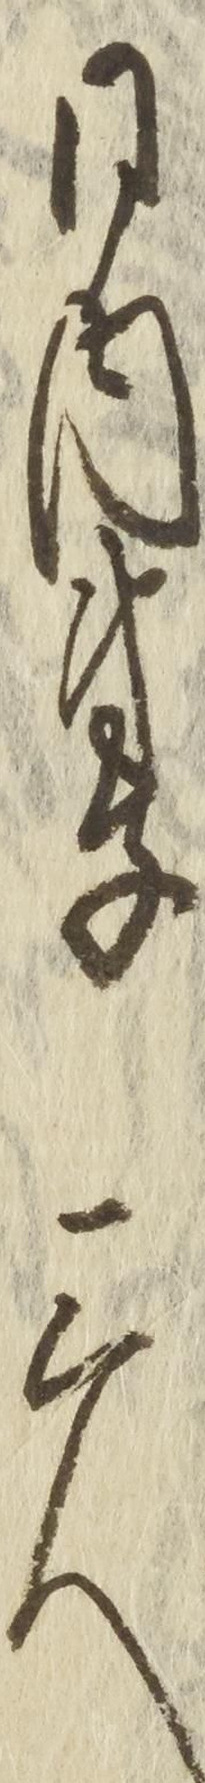同内付子三人
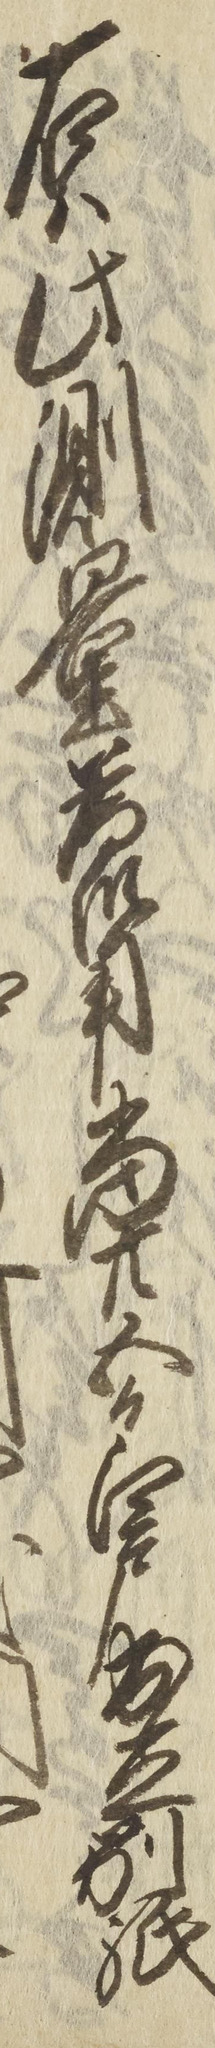右は此測量為御用当廿五日江戸出立別紙
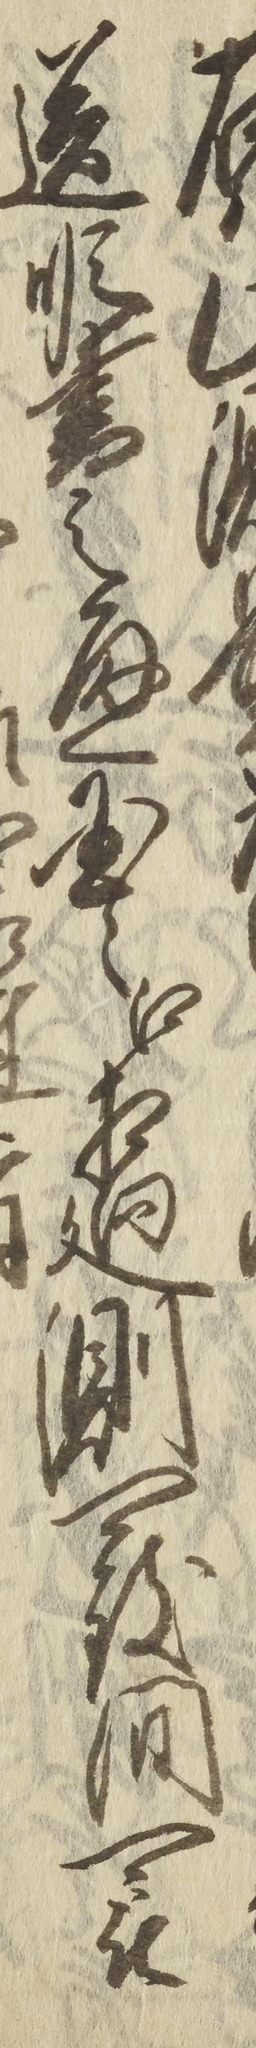送順書之通国々江相廻測可致間可被

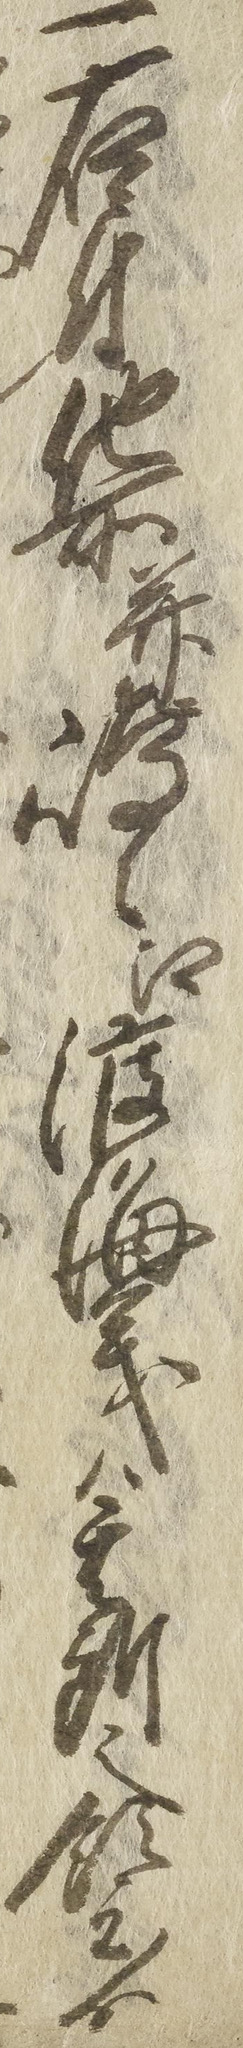一右ニ付他所并嶋々江渡海儀は其所之領主ゟ
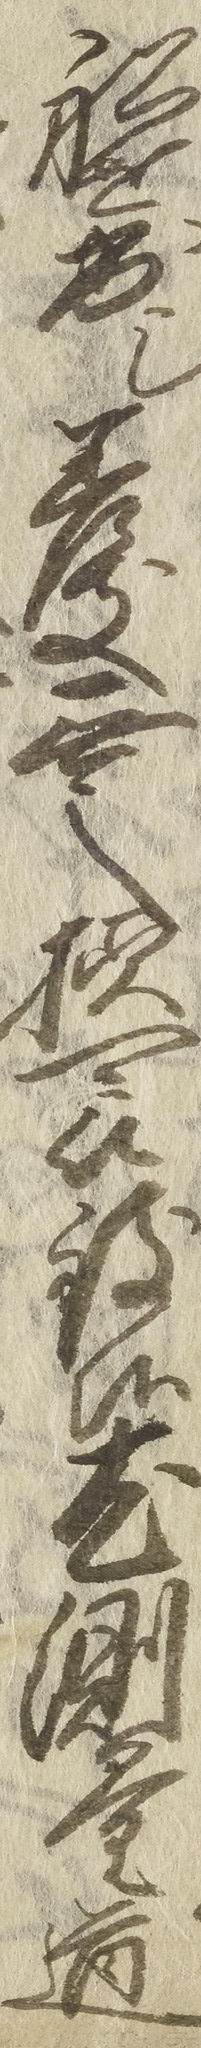船を出シ差支無之様可被致候尤測量道
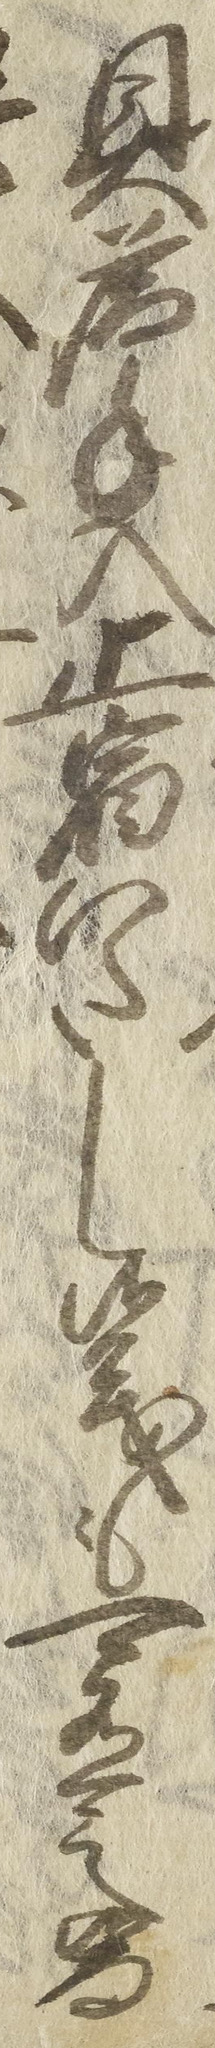具為手入止宿いたし候義も可有之候間
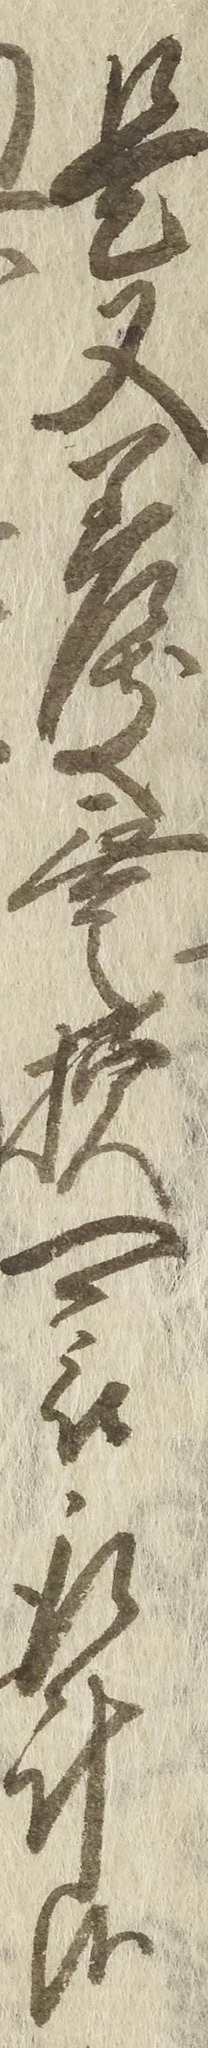是又差支無之様可被取計候
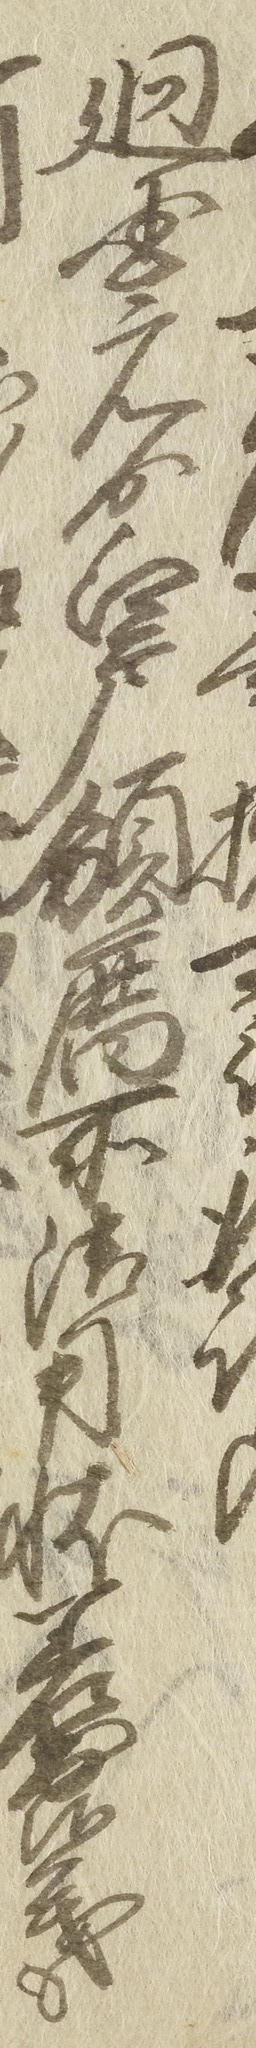一廻国元ゟ江戸頒暦所御用状差出候義も
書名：天文方御廻御先触写
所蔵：東京大学地震研究所図書室 Earthquake Research Institute Library, The University of Tokyo, JAPAN
